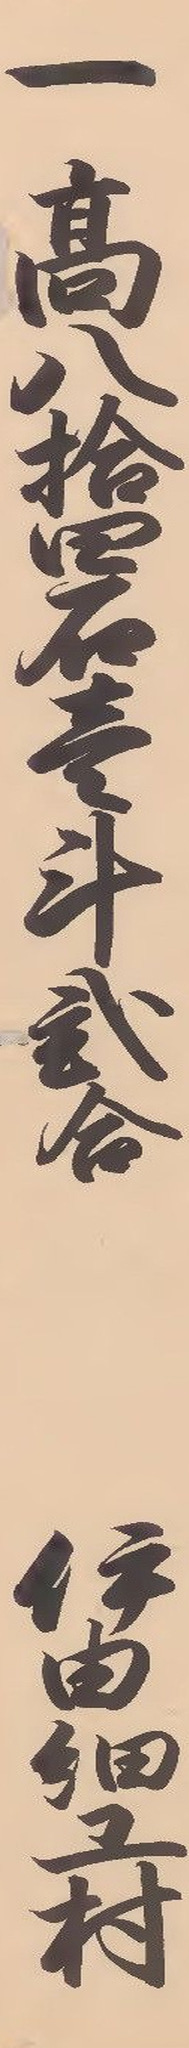一高八拾四石壱斗弐合伊由細工村

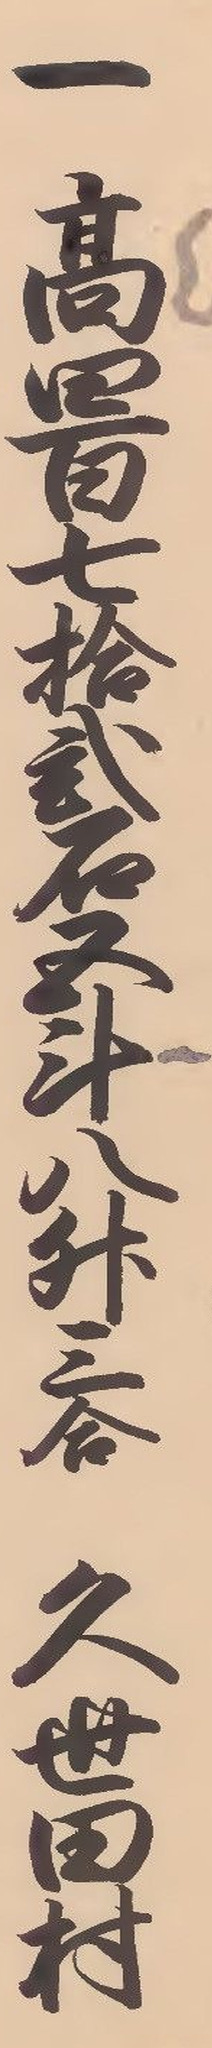一高四百七拾弐石五斗八升三合久世田村
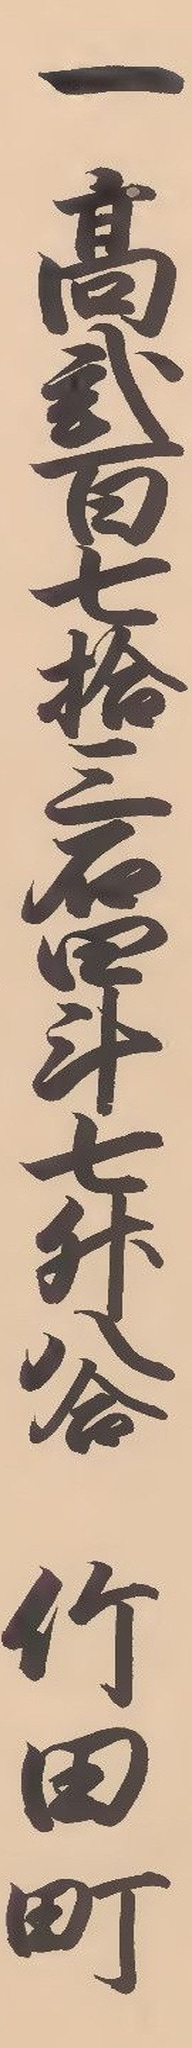一高弐百七拾三石四斗七升八合竹田村
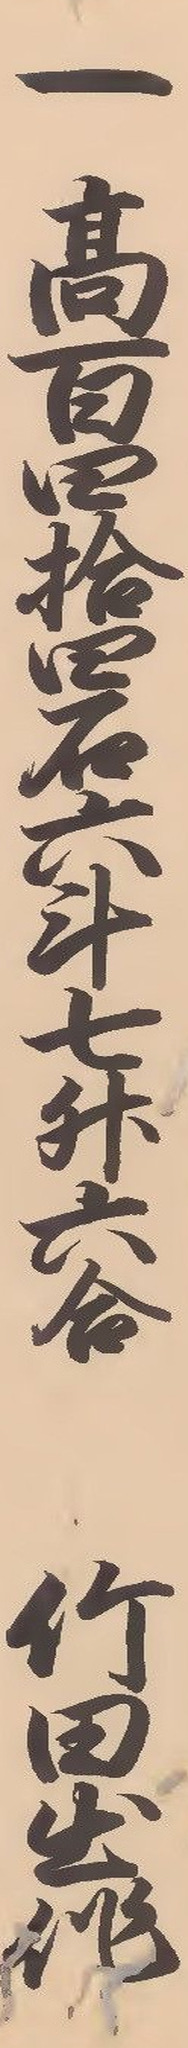一高百四拾四石六斗七升六合竹田出作
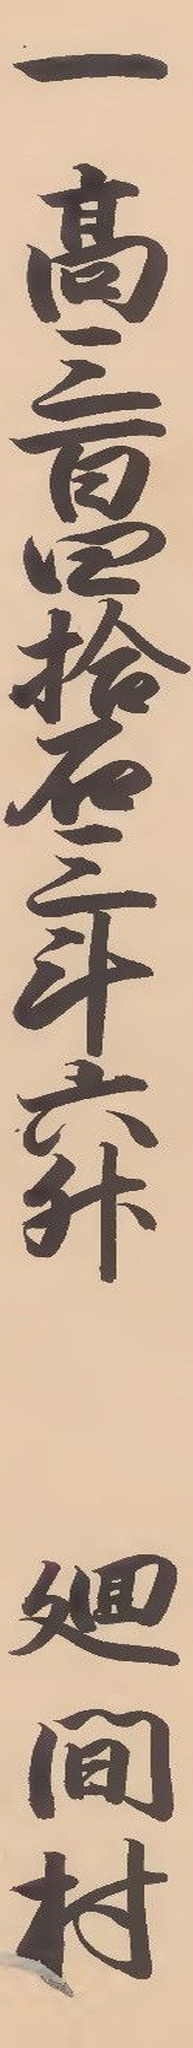一高三百四拾石三斗六升廻間村
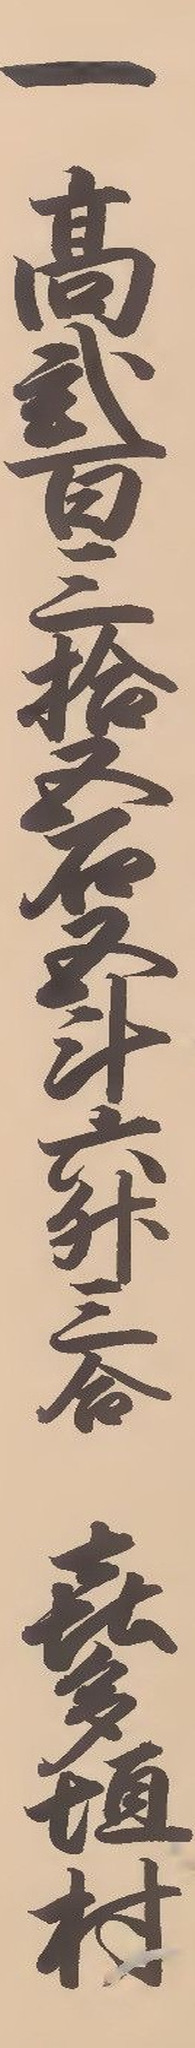一高弐百三拾五石五斗六升三合喜多垣村
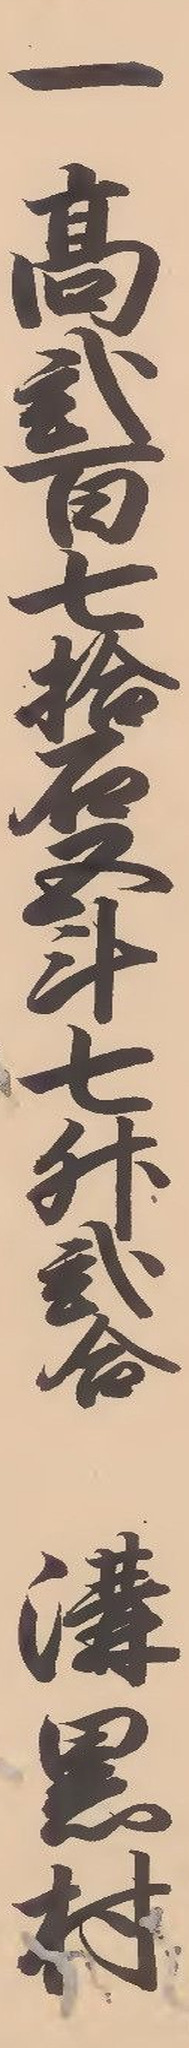一高弐百七拾石五斗七升弐合溝黒村
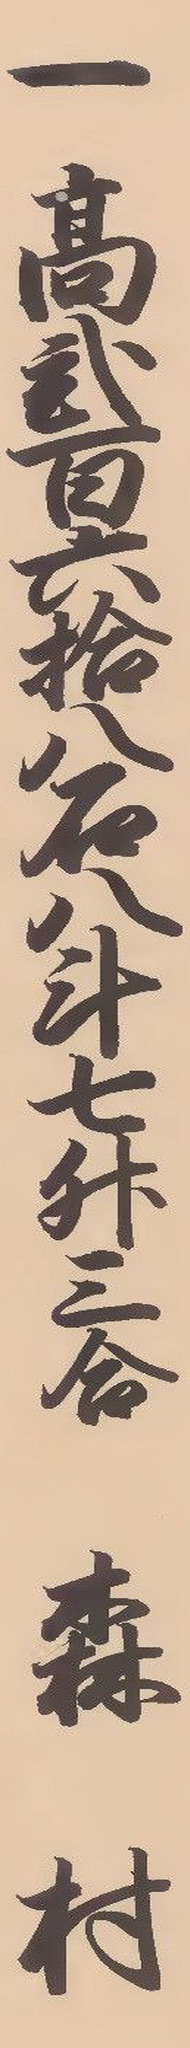一高弐百六拾八石八斗七升三合森村
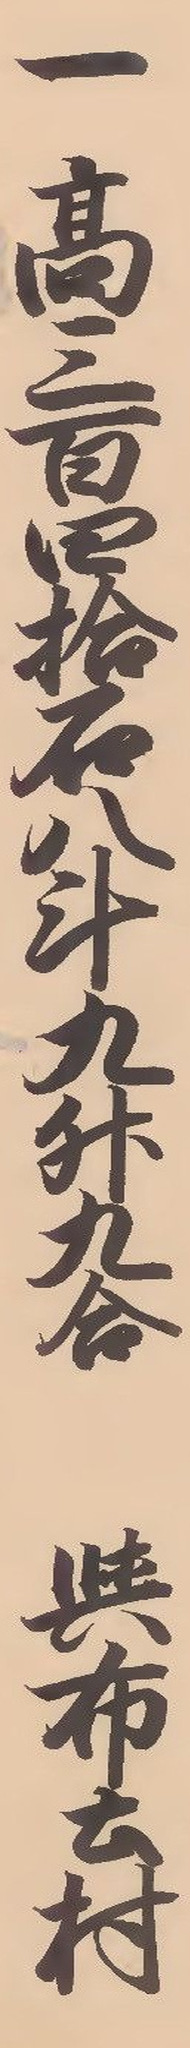一高三百四拾石八斗九升九合与布土村

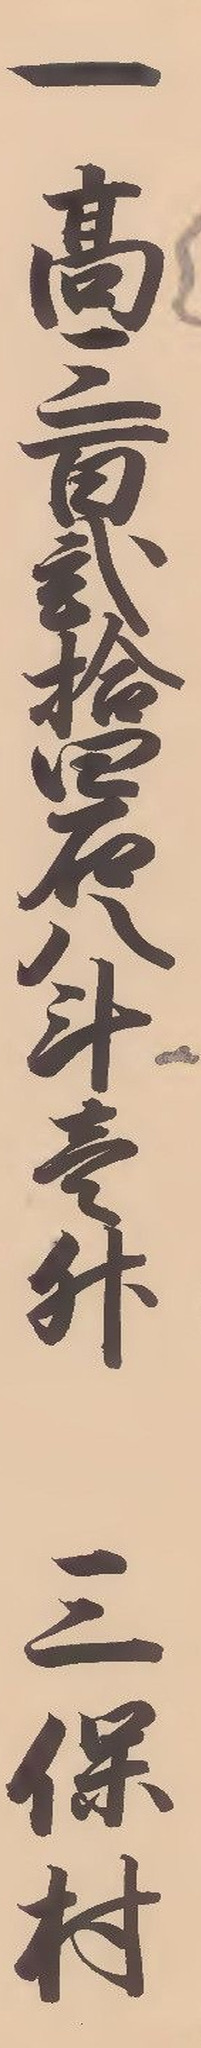一高三百弐拾四石八斗壱升三保村
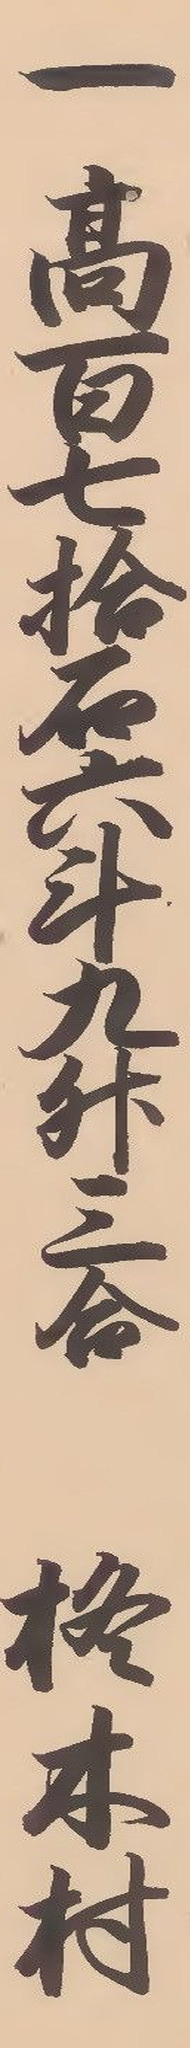一高百七拾石六斗九升三合柊木村
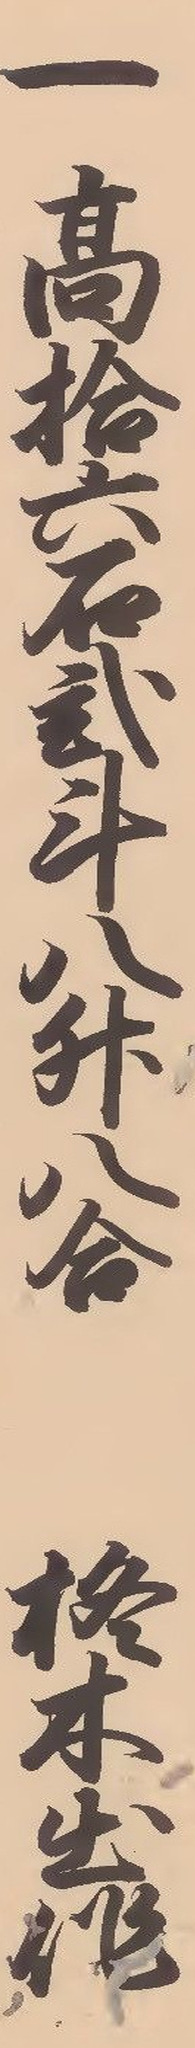一高拾六石弐斗八升八合柊木出作
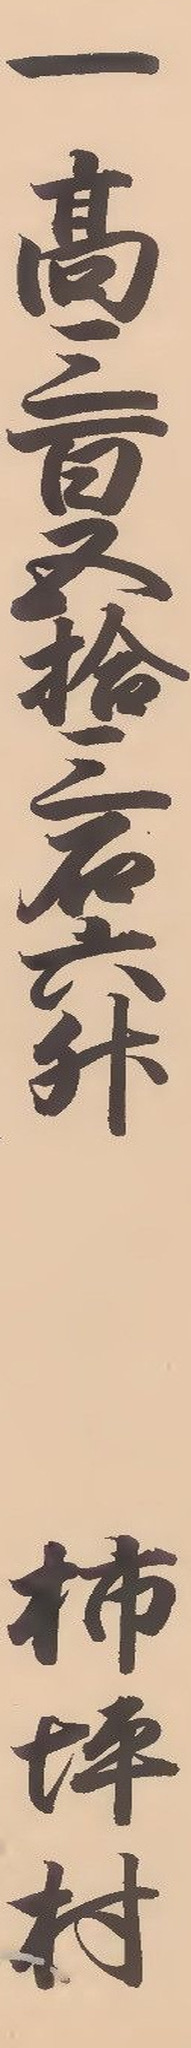一高三百五拾三石六升柿坪村
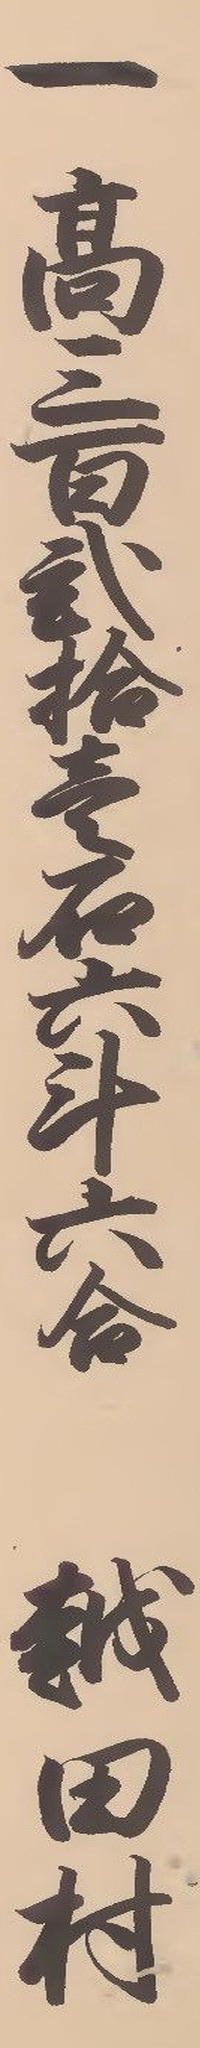一高三百弐拾壱石六斗六合越田村
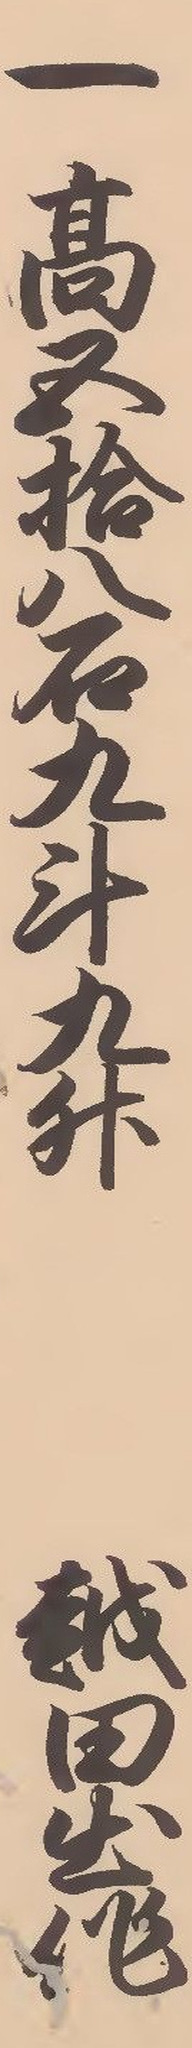一高五拾八石九斗九升越田出作
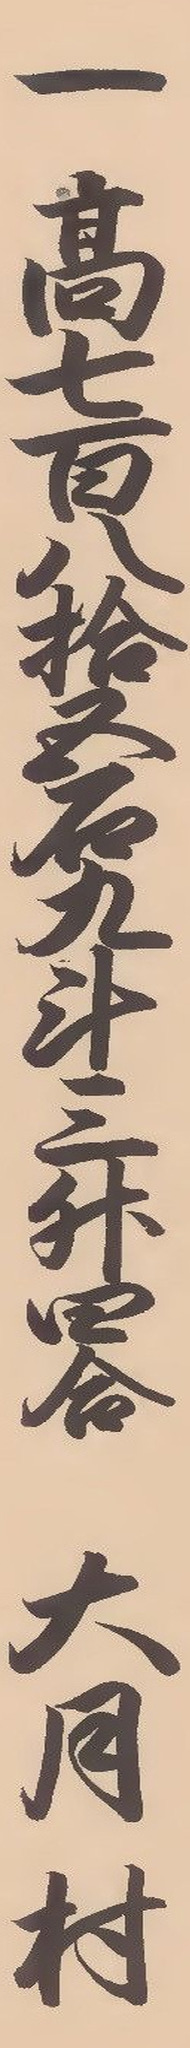一高七百八拾五石九斗三升四合大月村
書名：但馬国郷帳
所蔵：国立公文書館 National Archives of Japan
